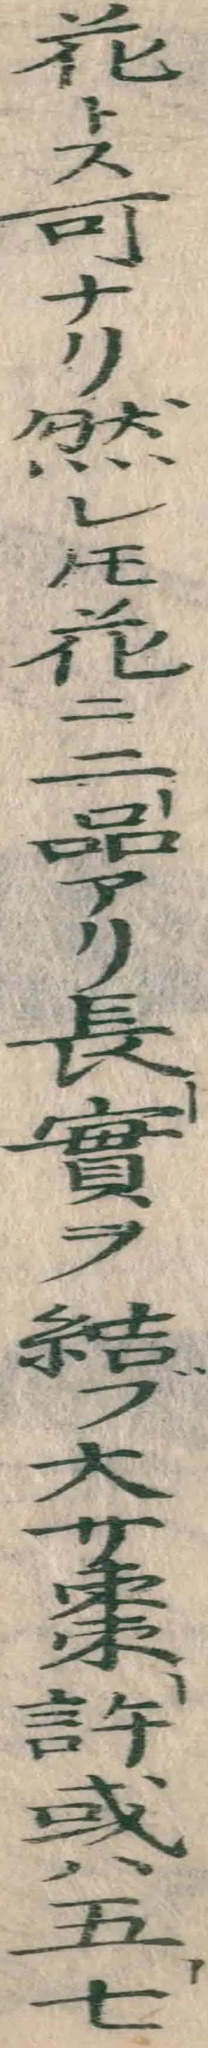花トス可ナリ然レ𪜈花ニ二-品アリ長-実ヲ結ブ大サ棗-許或ハ五-七
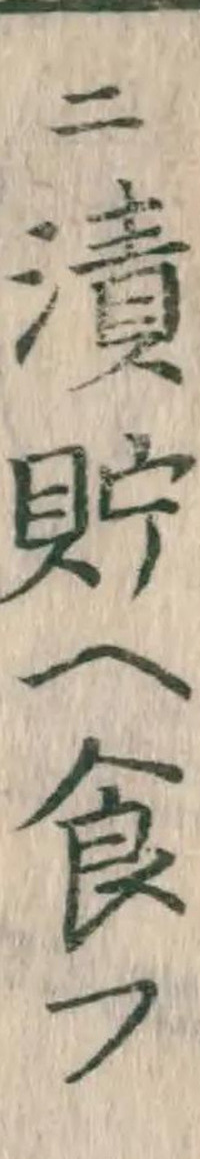ニ漬貯ヘ食フ

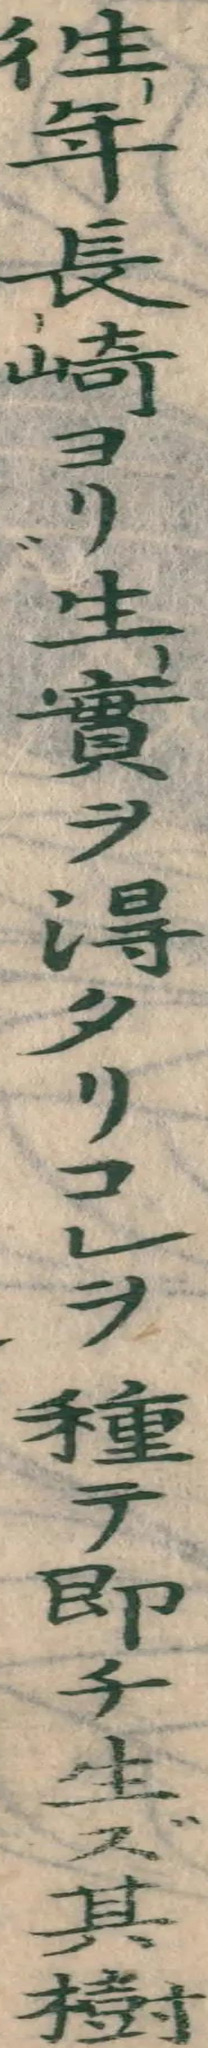往-年長-崎ヨリ生-実ヲ得タリコレヲ種テ即チ生ズ其樹
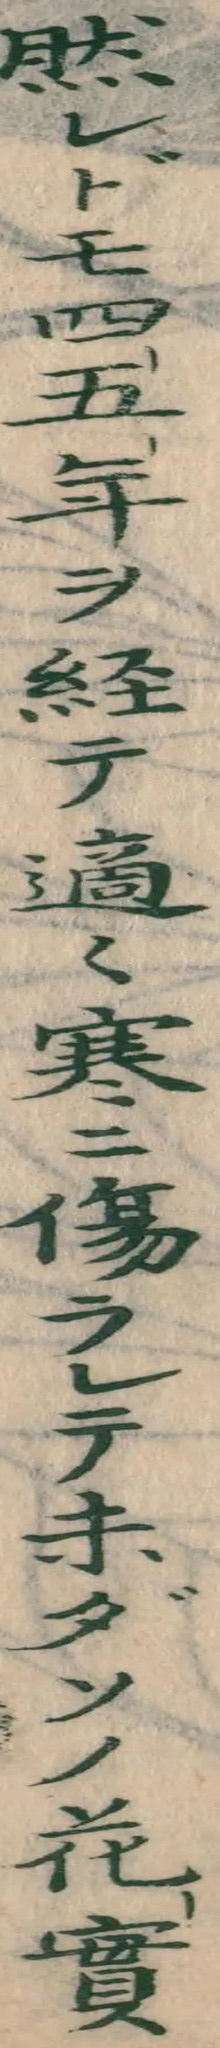然レドモ四-五-年ヲ経テ適〻寒ニ傷ラレテ未ダソノ花-実
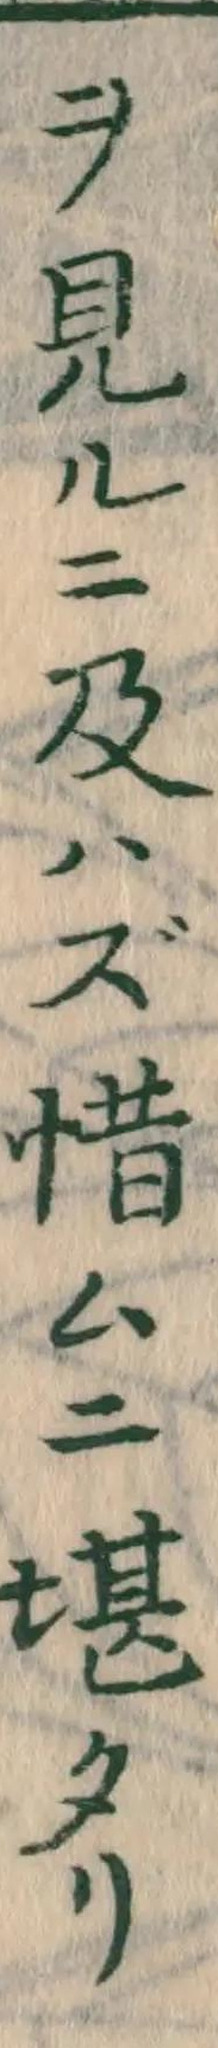ヲ見ルニ及ハズ惜ムニ堪タリ
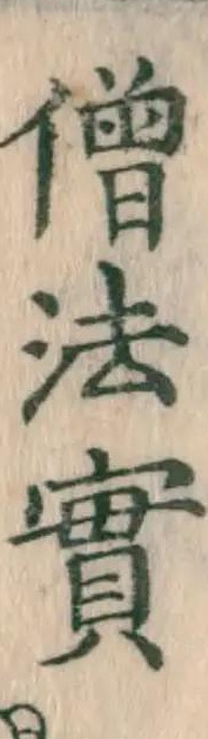僧法実

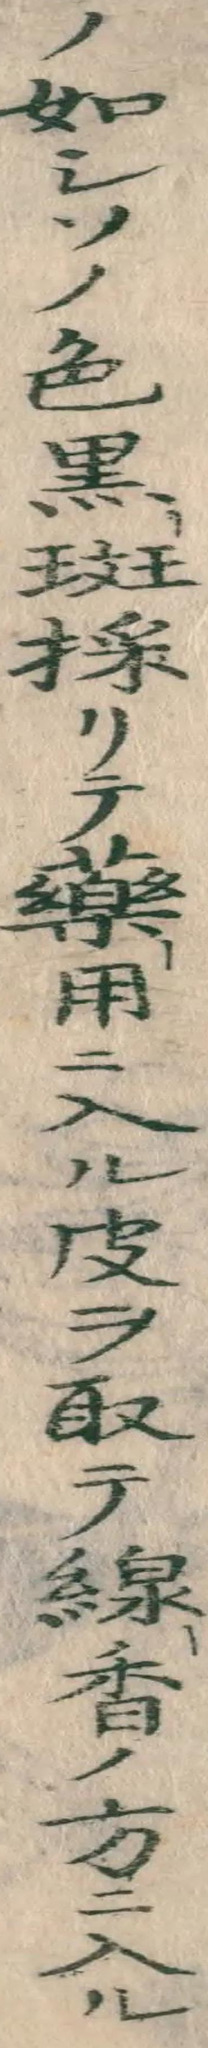ノ如シソノ色黒-斑採リテ薬-用ニ入ル皮ヲ取テ線-香ノ方ニ入ル
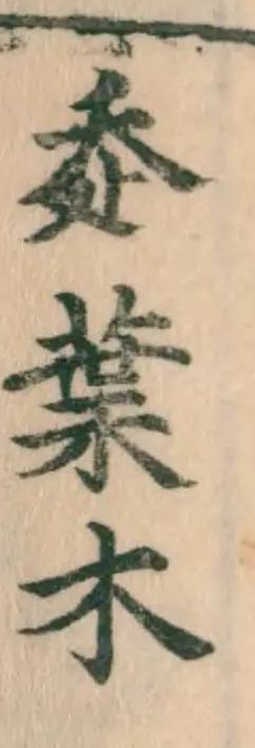走葉木

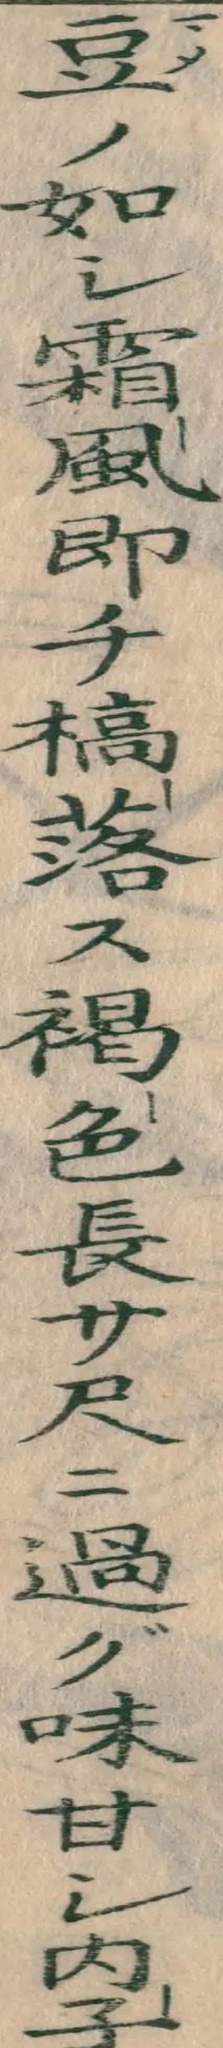豆ノ如シ霜-風即チ槁-落ス褐-色長サ尺ニ過グ味甘シ内-子
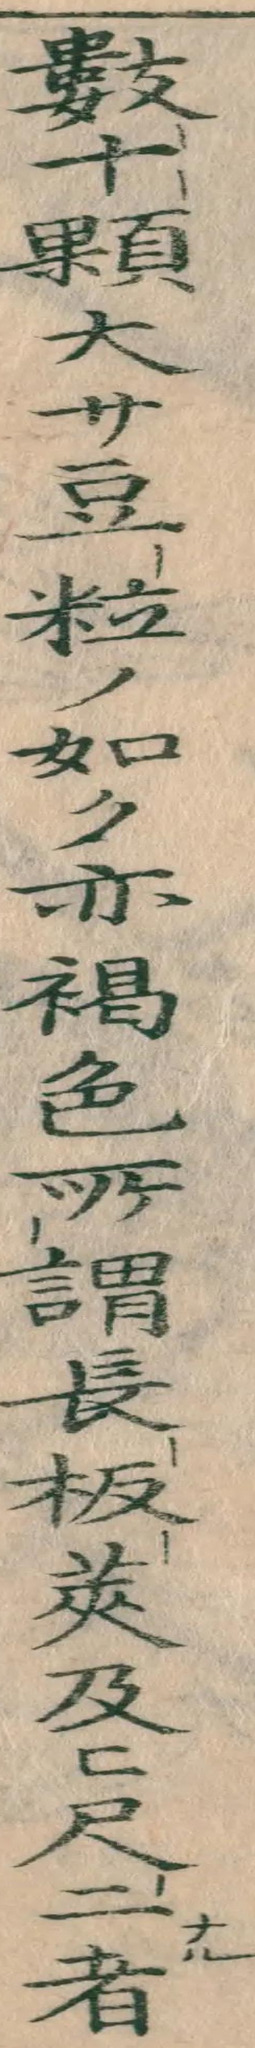数-十-顆大サ豆-粒ノ如ク亦褐色所-謂長-板-莢及ヒ尺-二者
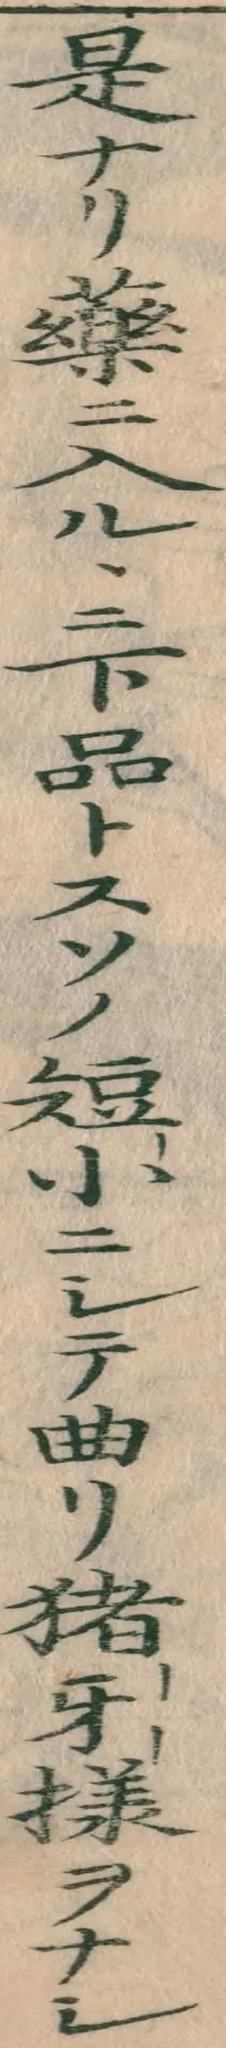是ナリ薬ニ入ルヽニ下品トスソノ短-小ニシテ曲リ猪-牙-様ヲナシ
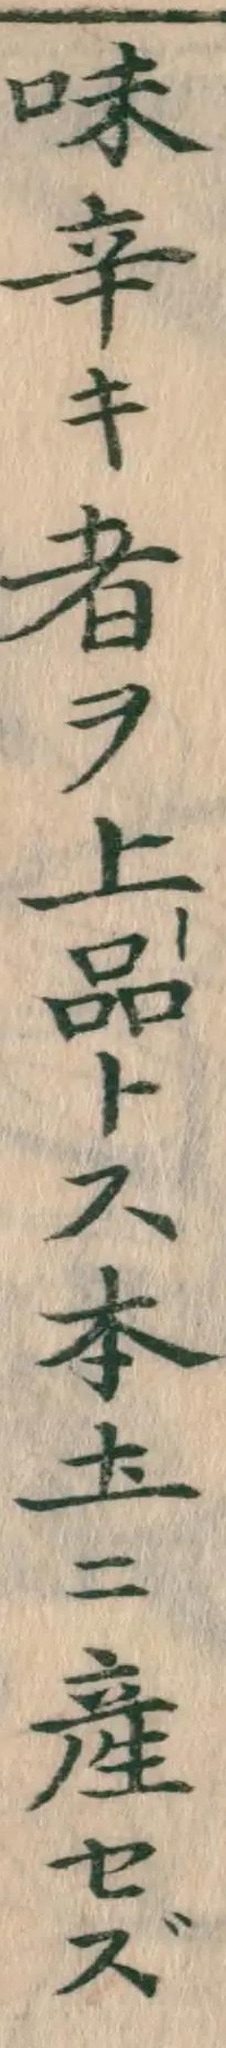味辛キ者ヲ上-品トス本土ニ産セズ
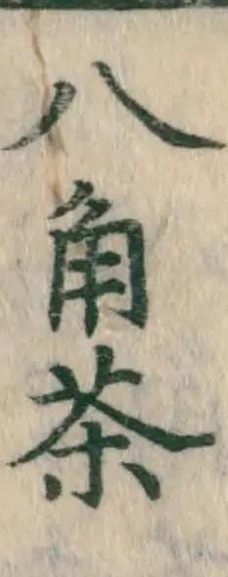八角茶

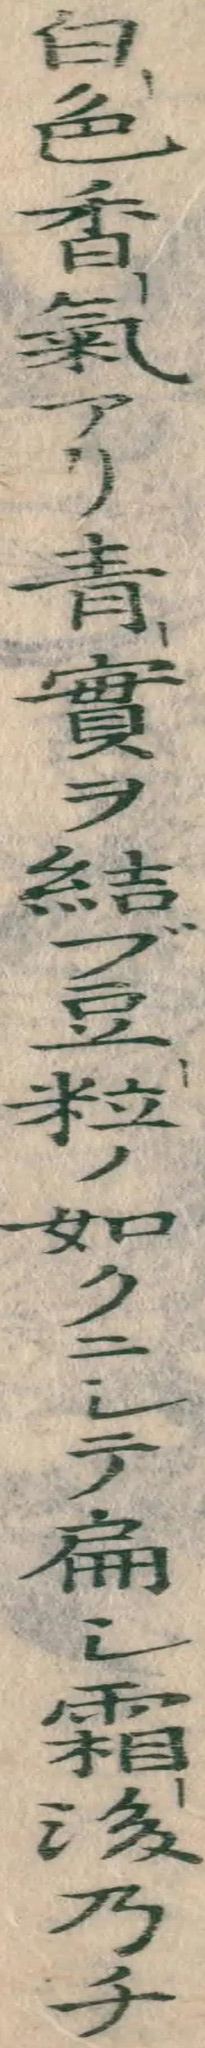白-色香-気アリ青-実ヲ結ブ豆-粒ノ如クニシテ扁シ霜-後乃チ
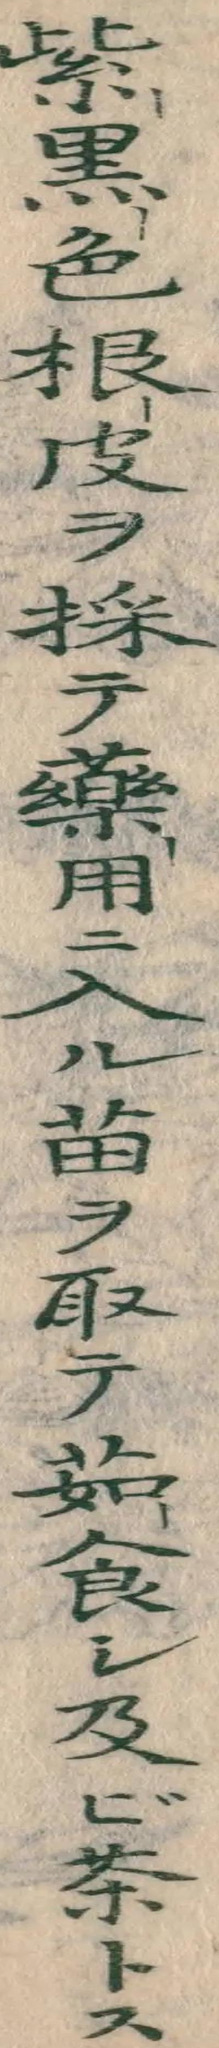紫-黒-色根-皮ヲ採テ薬-用ニ入ル苗ヲ取テ茹-食シ及ビ茶トス

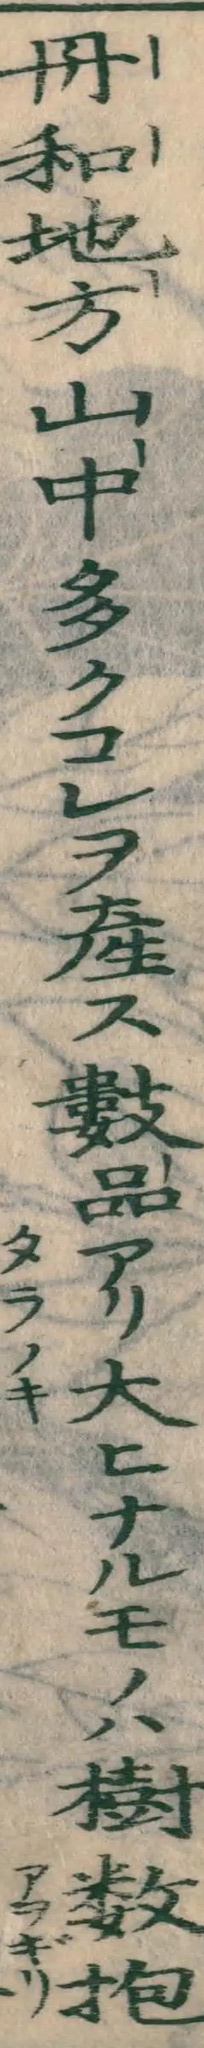丹和地-方山-中多クコレヲ産ス数-品アリ大ヒナルモノハ樹数-抱
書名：花彙 草部4巻木部4巻. [2]
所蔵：国立国会図書館 National Diet Library, JAPAN
